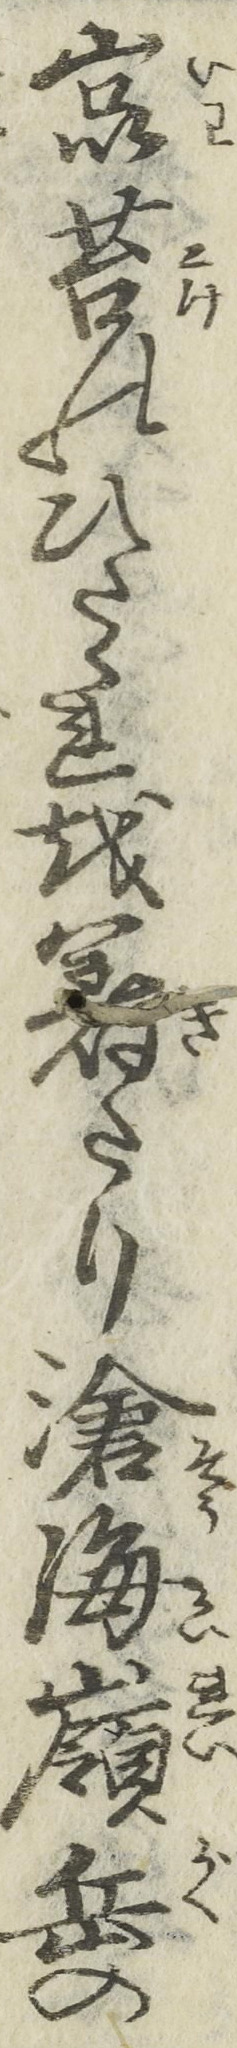岩苔のひたゝれを着たり滄海嶺岳の
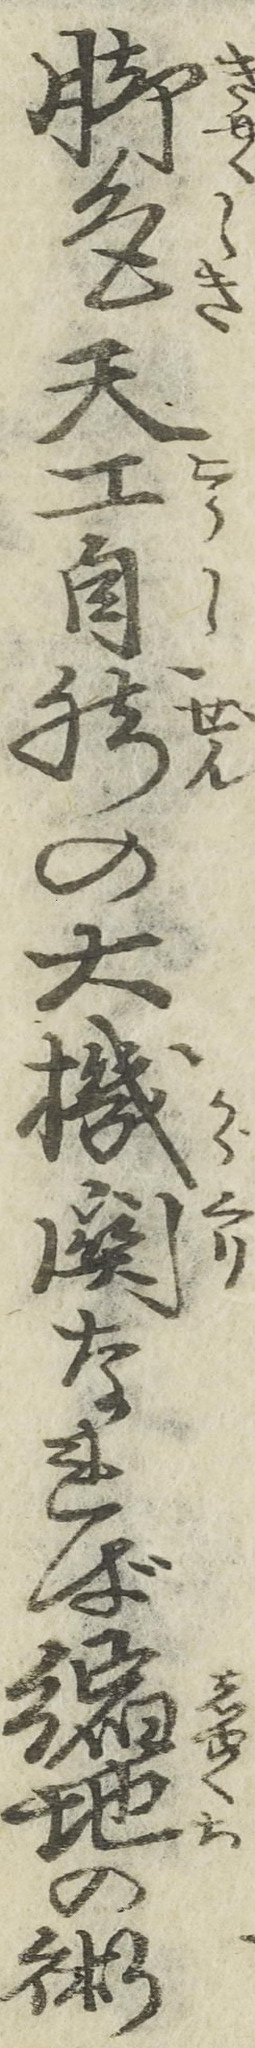脚色天工自然の大機関なれば縮地の術
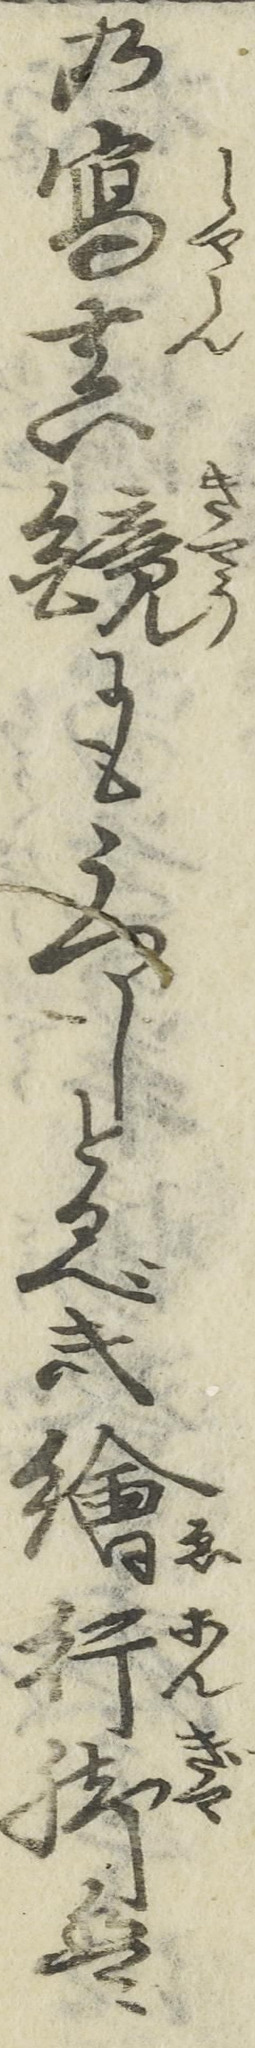の写真鏡にもうつしとるべき絵行脚は
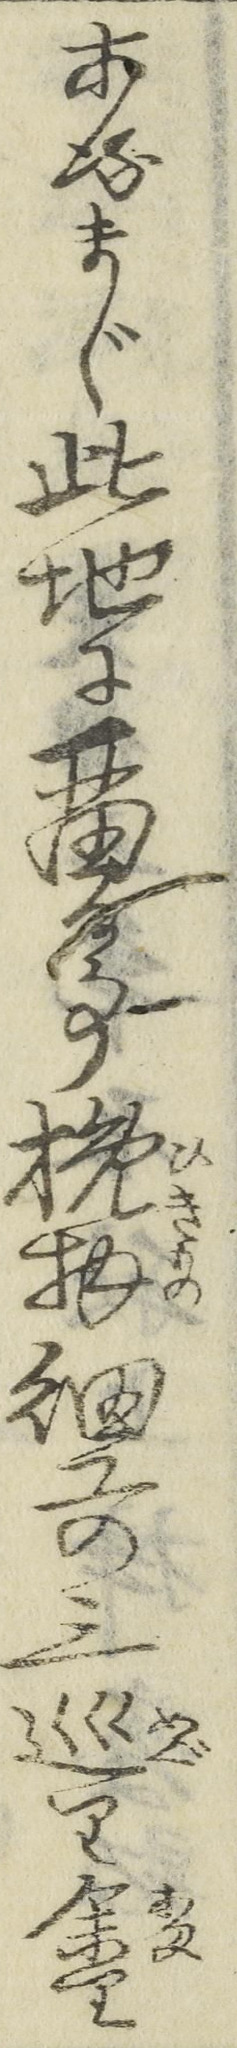あるまじ此地にる事挽物細工の三巡り余り
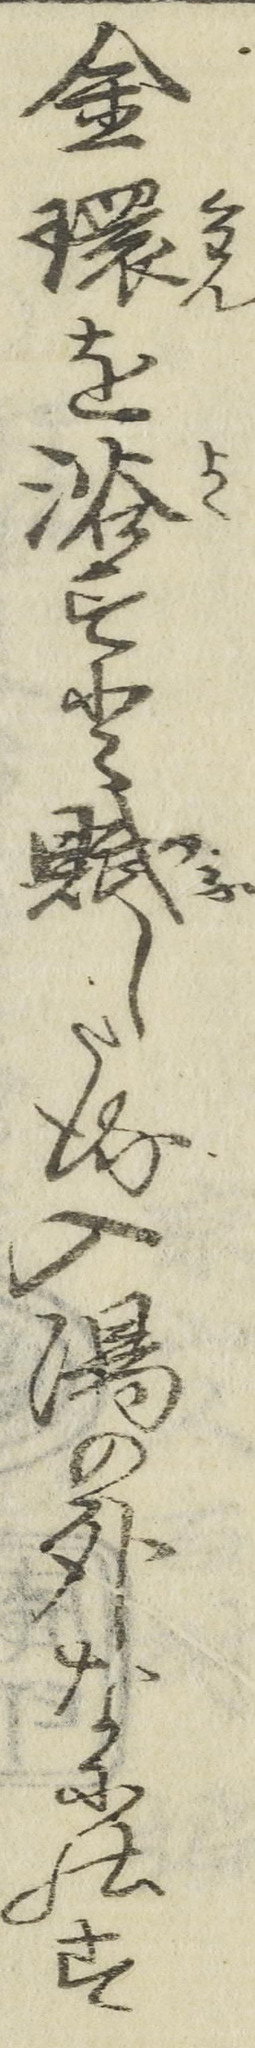金環を浴すと賦したる入湯の外なにのす
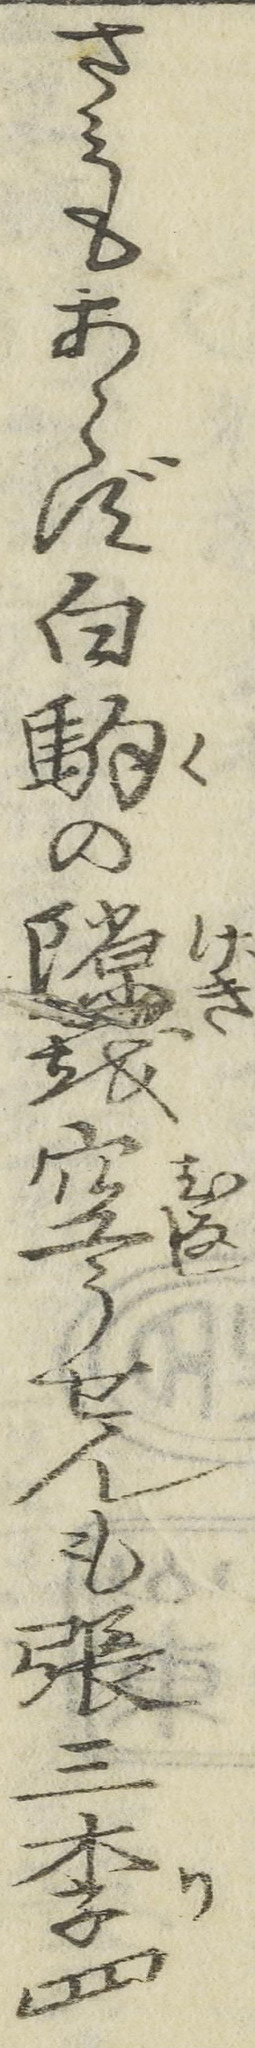さみもあらず白駒の隙を空うせんも張三李四
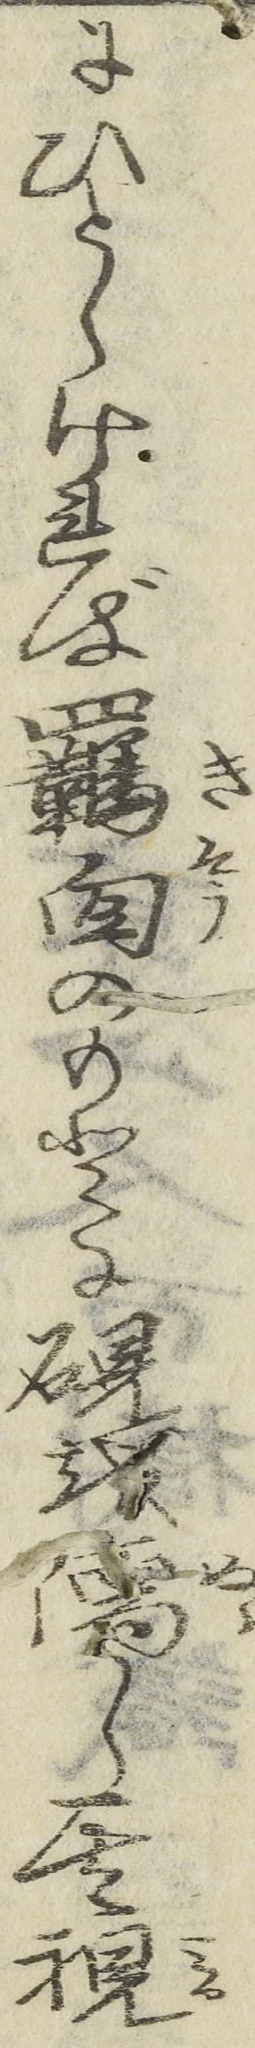にひとしければ羈囱のもとに硯を濡し其視
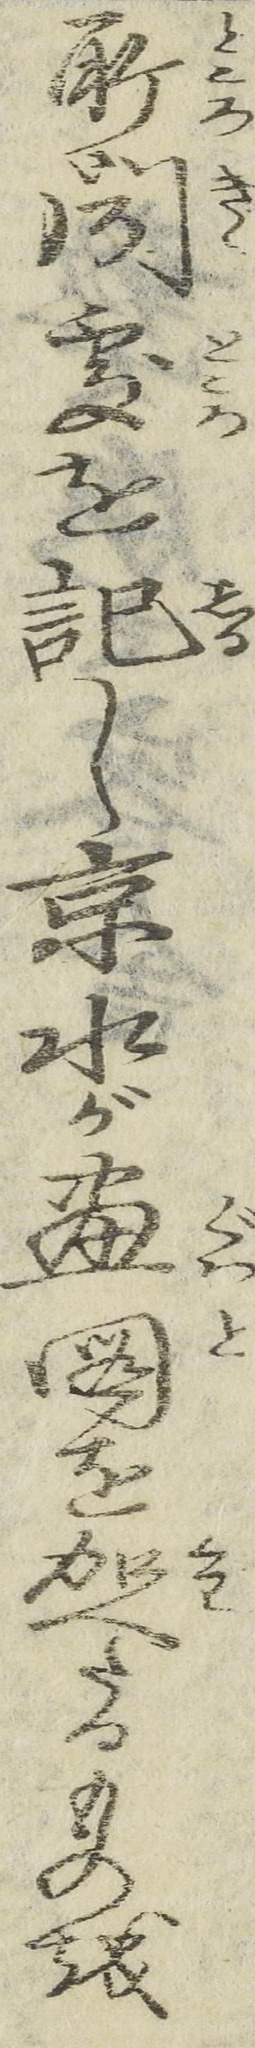所聞処を記し京水が画図を加へたるものを
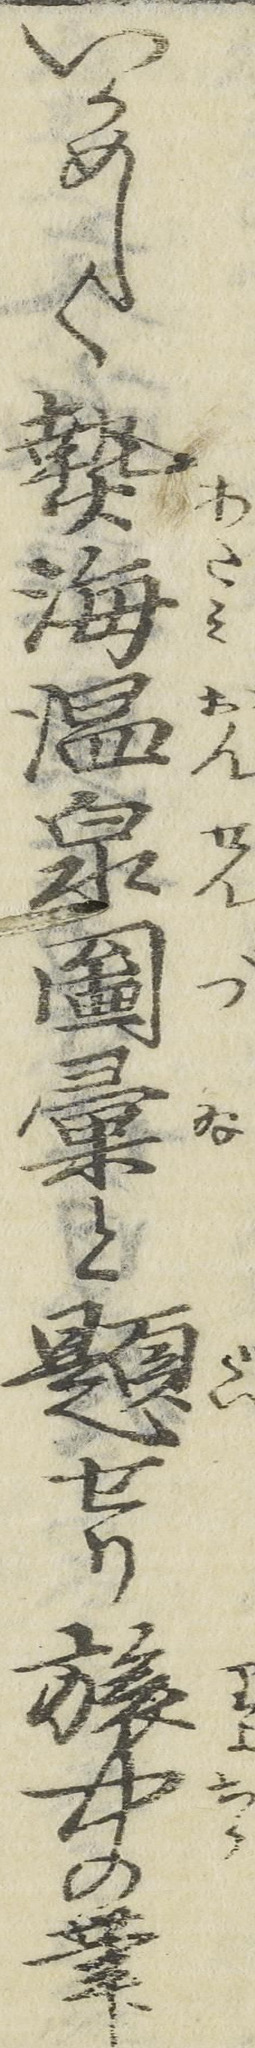いかめしく熱海温泉図彙と題せり旅中の筆
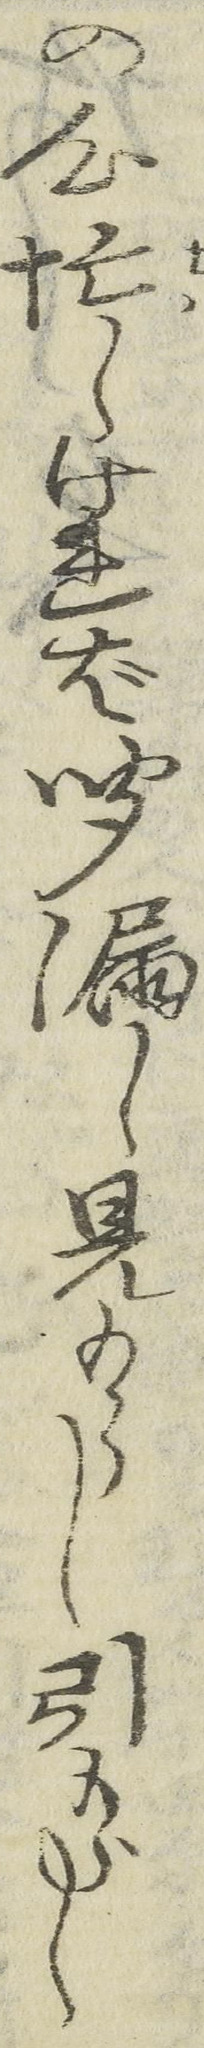の心忙しければ聞漏し見もらし引もらし
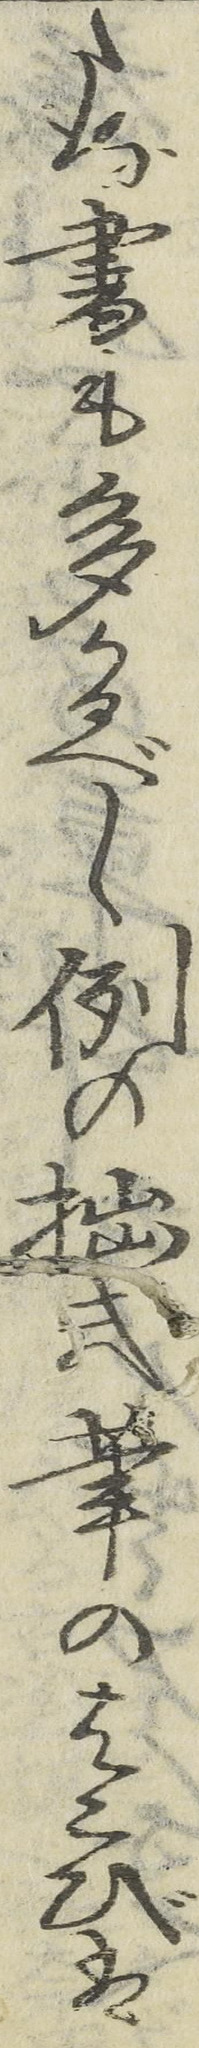たる書も多かるべし例の拙き筆のはこびは

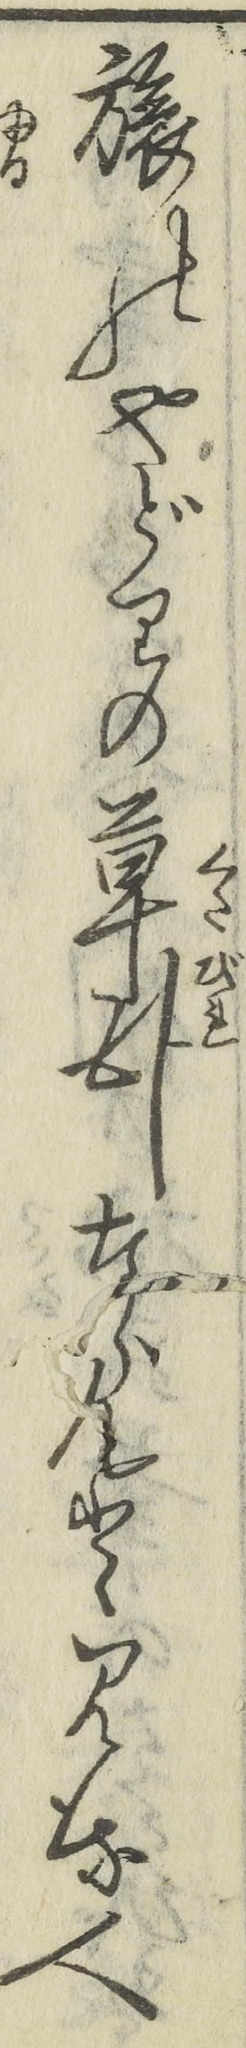旅のやどりの草臥ならんと見る人
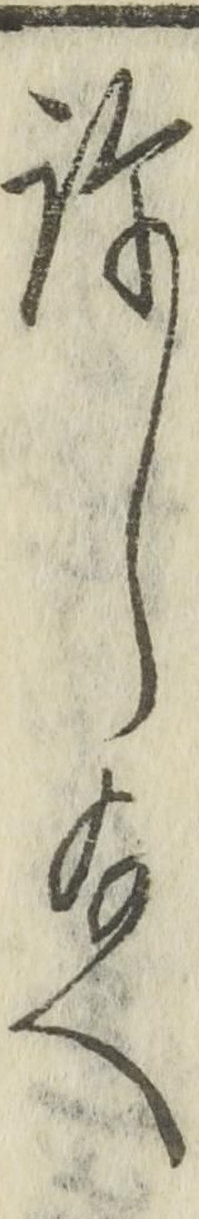許し給へ
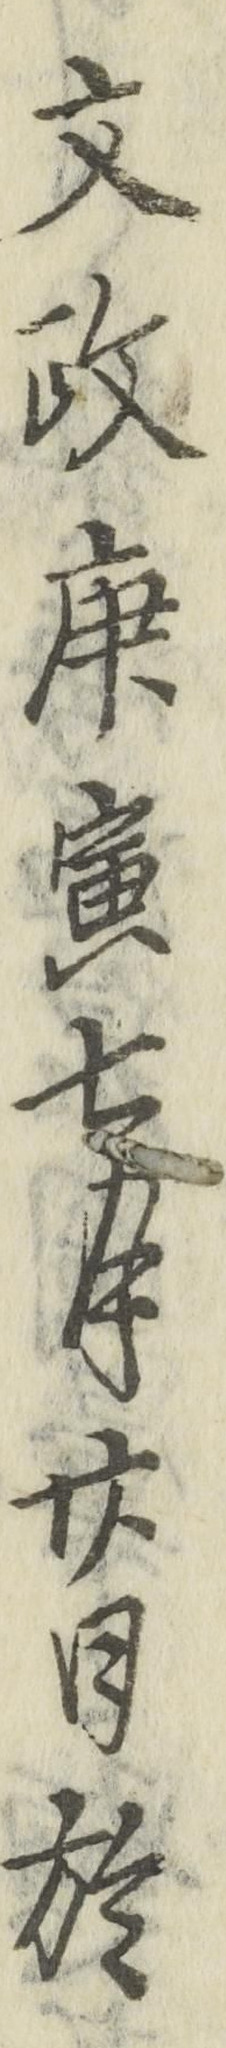文政庚寅七月廿日於
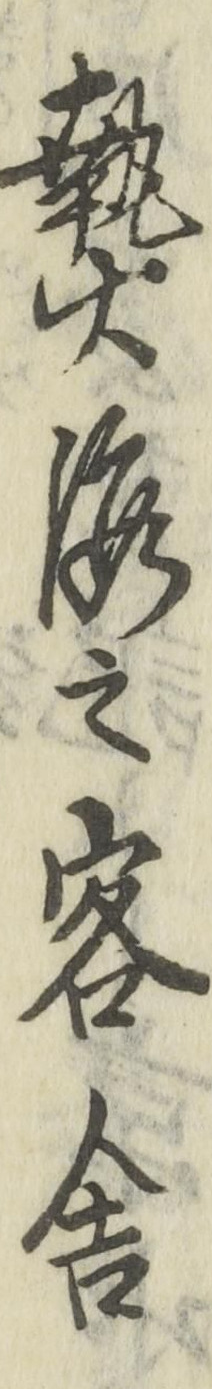熱海の客舎
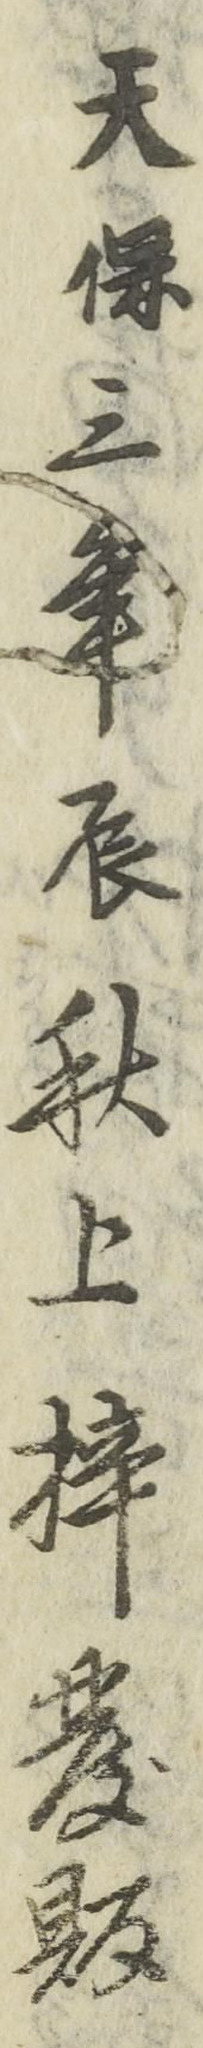天保三年辰秋上梓発販
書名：熱海温泉圖彙
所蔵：東京大学地震研究所図書室 Earthquake Research Institute Library, The University of Tokyo, JAPAN
